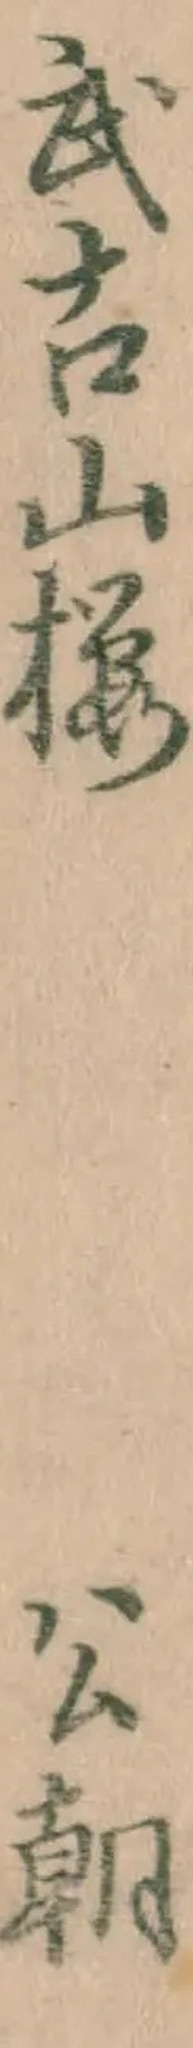武古山桜公朝
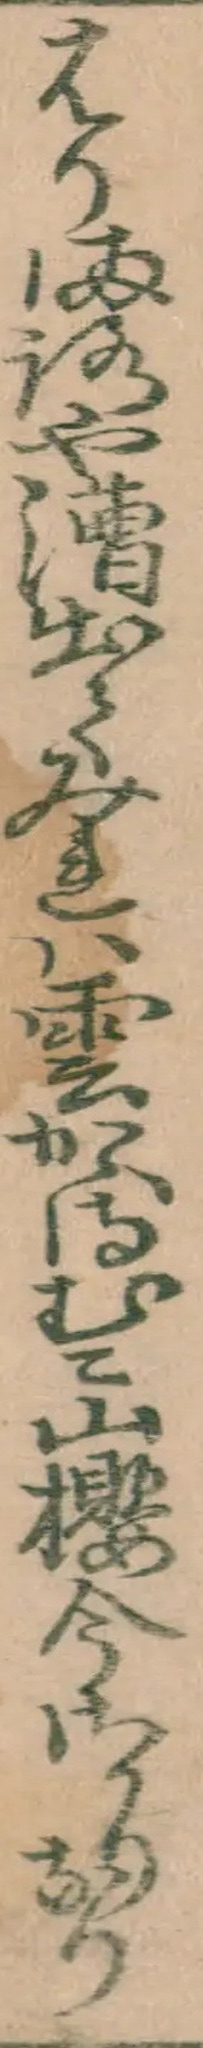はりま路や漕出てみれは雲かふるむこ山桜今さかりなり
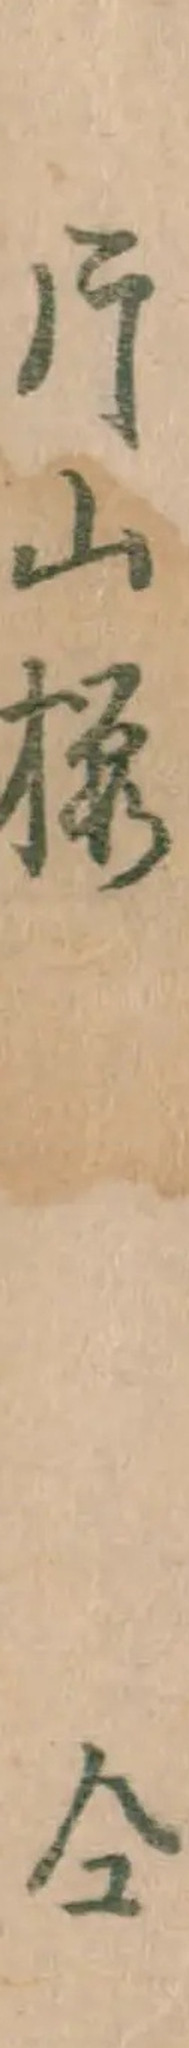片山桜仝
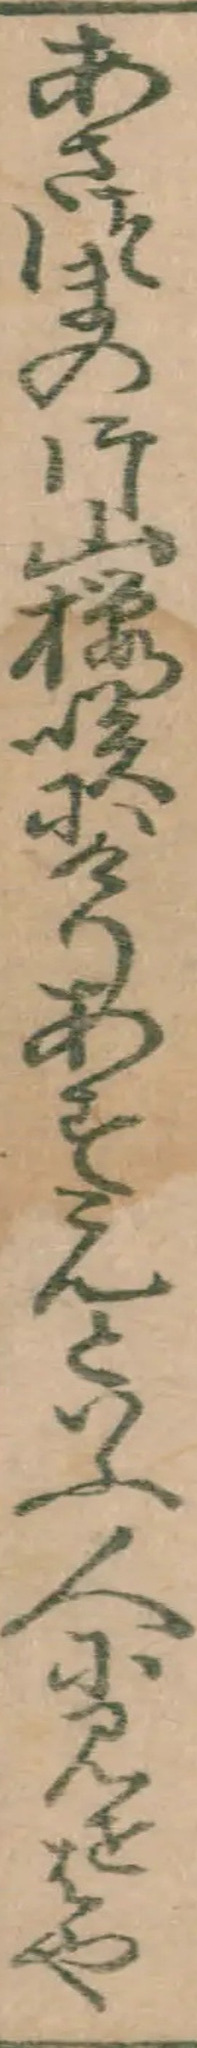あさつまの片山桜咲にけりあすこんといふ人に見せはや

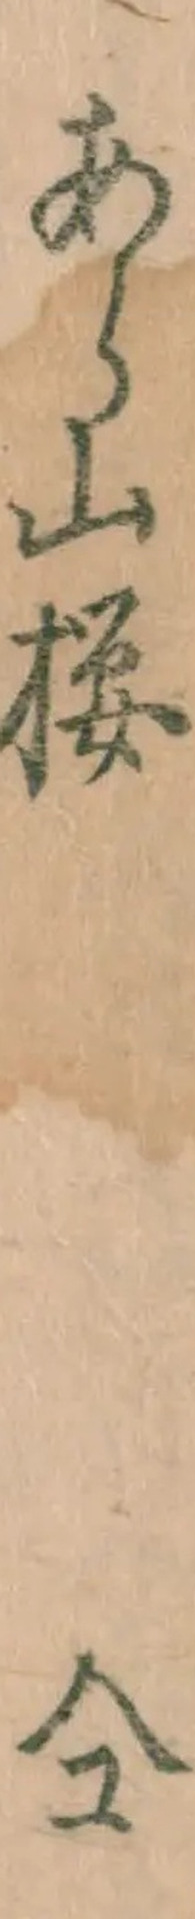あら山桜仝
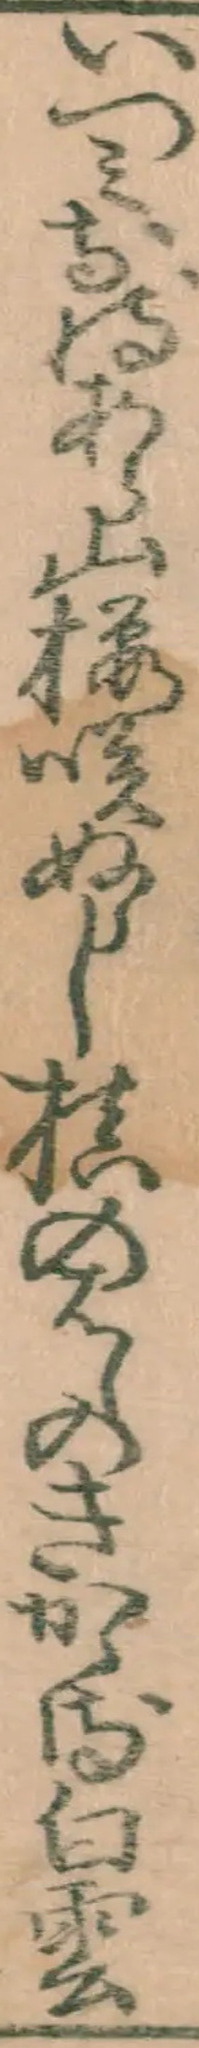いつみなるあら山桜咲ぬらし槙のはしのきかゝる白雲
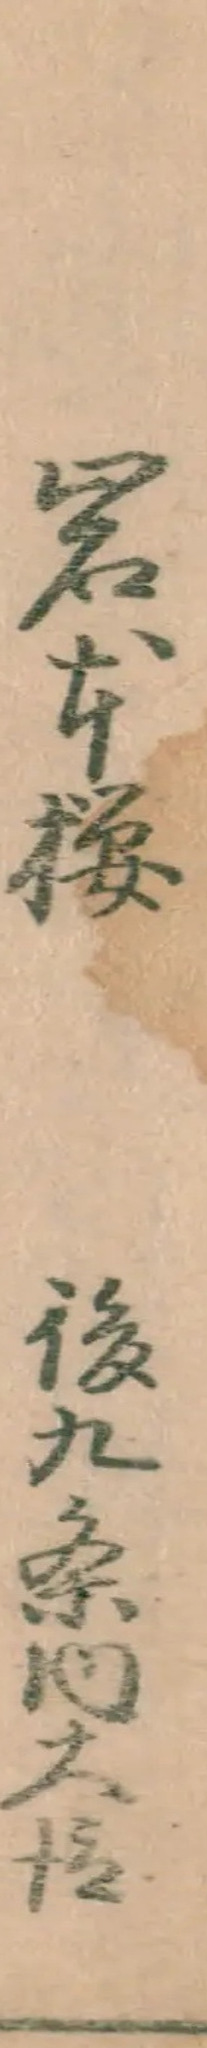岩本桜後九条内大臣
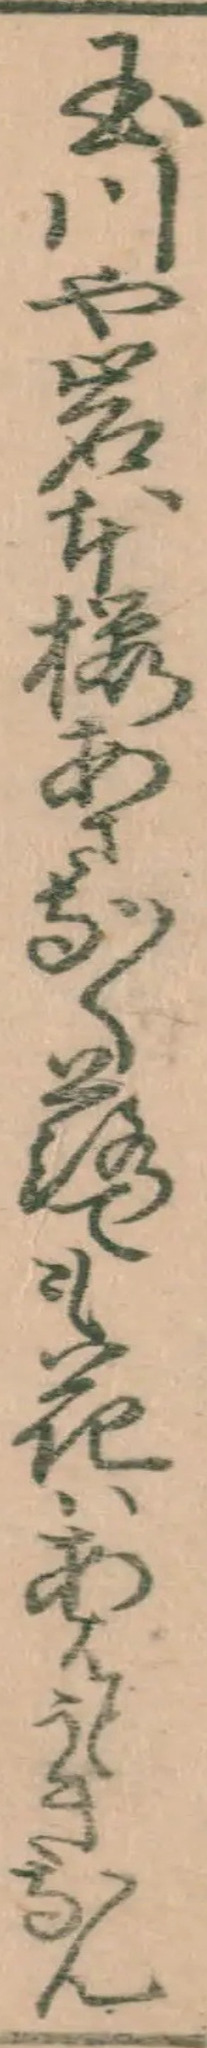玉川や岩本桜あさな〳〵落ても花はあはとうきなん
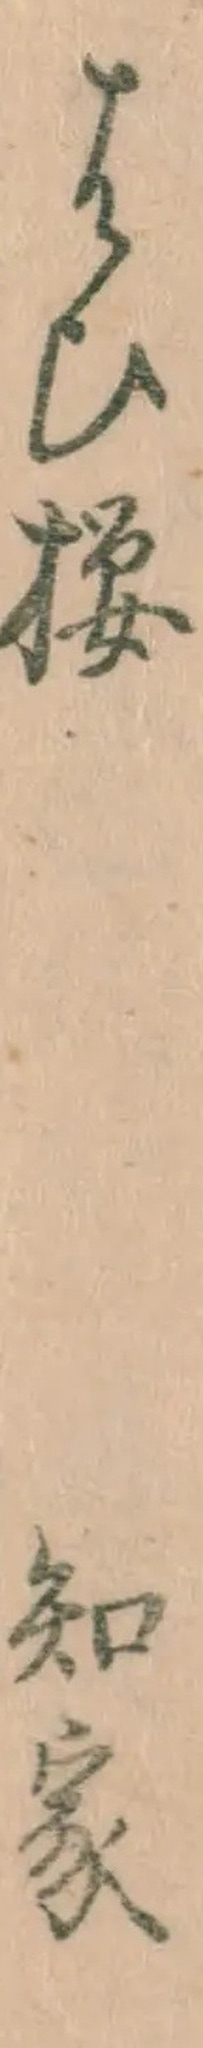はひ桜知家
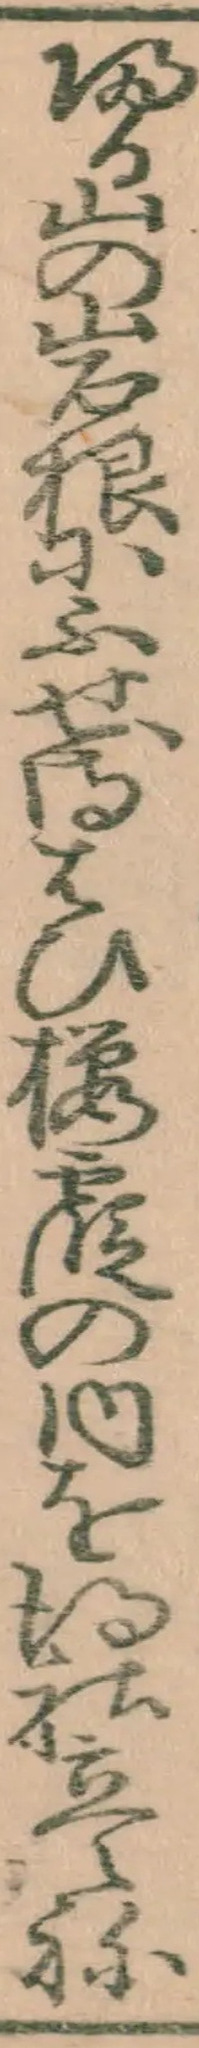ふる山の岩根にふせるはひ桜霞の内を得社立てね
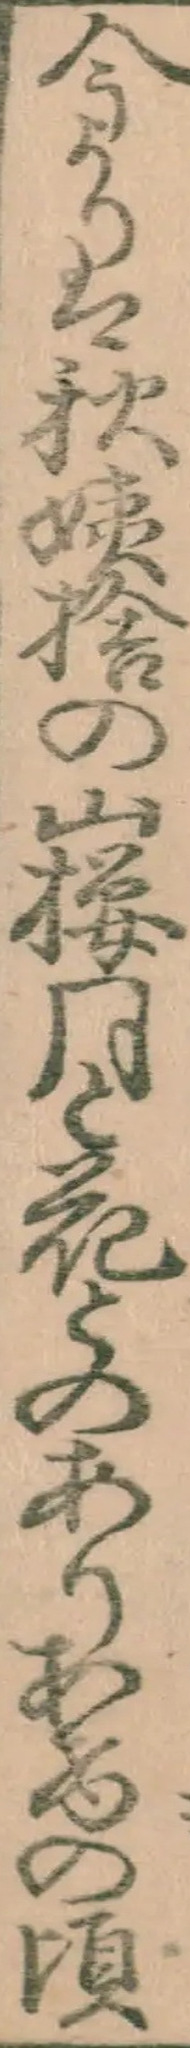今よりは秋姨捨の山桜月と花とのありあけの頃
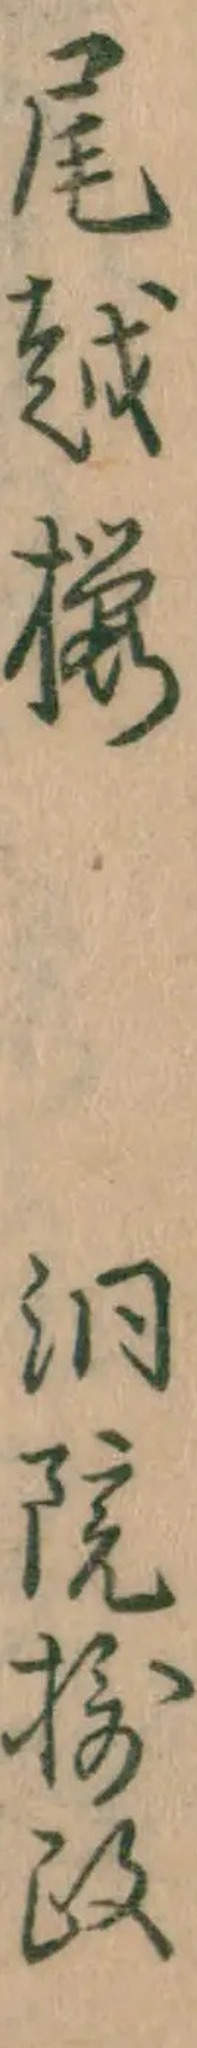尾越桜洞院摂政
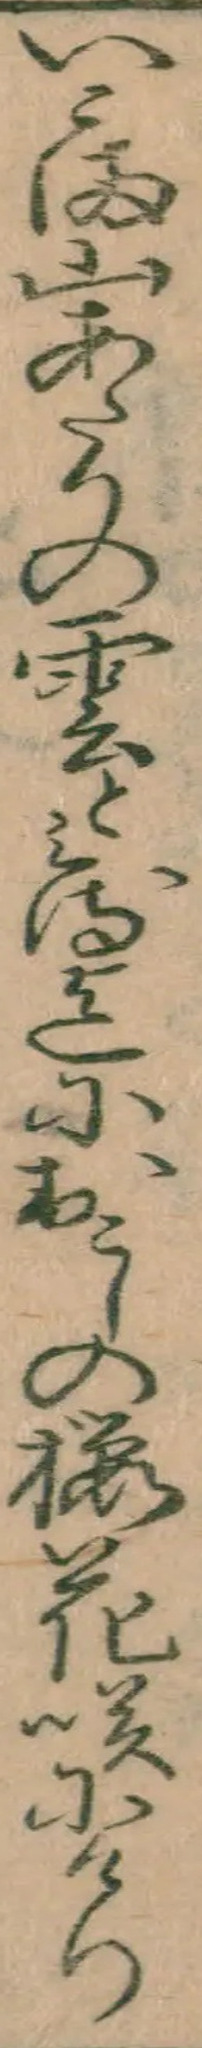いこま山あたりの雲とみる迄におこしの桜花咲にけり
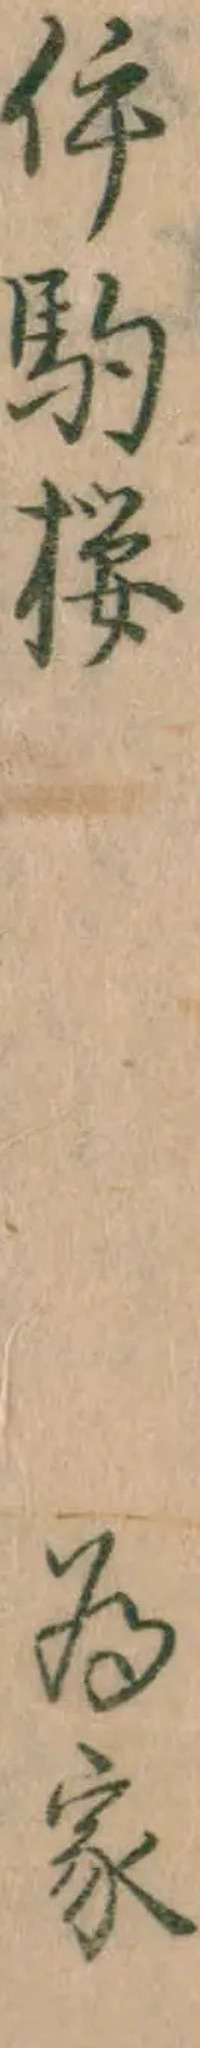伊駒桜為家
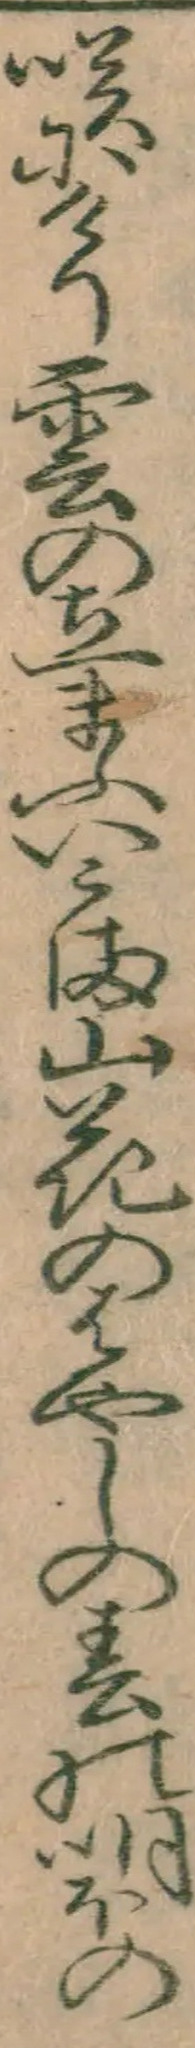咲にけり雲の立まふいこま山花のはやしの春の明ほの
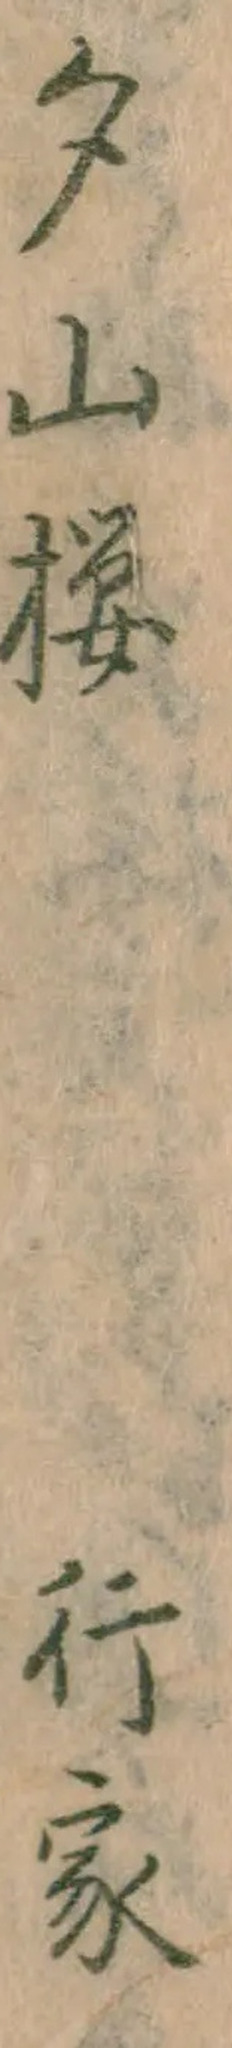夕山桜行家
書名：怡顔齋櫻品
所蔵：国立国会図書館 National Diet Library, JAPAN
